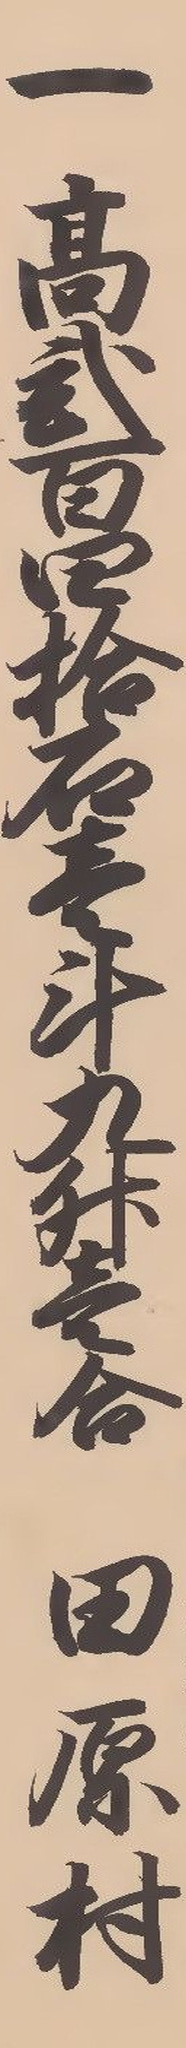一髙弐百四拾石壱斗九升壱合田原村
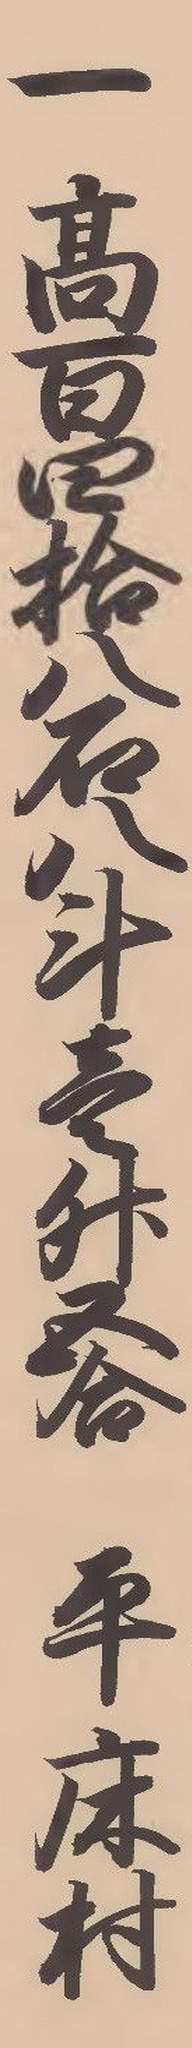一髙百四拾八石八斗壱升五合平床村
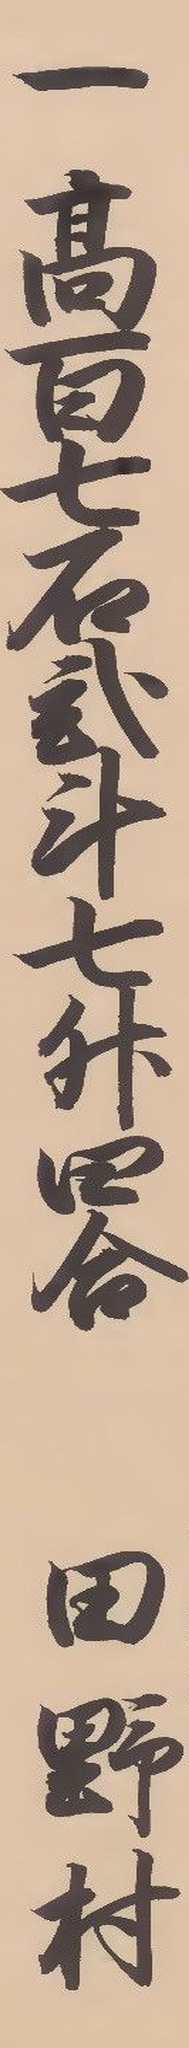一髙百七石弐斗七升四合田野村
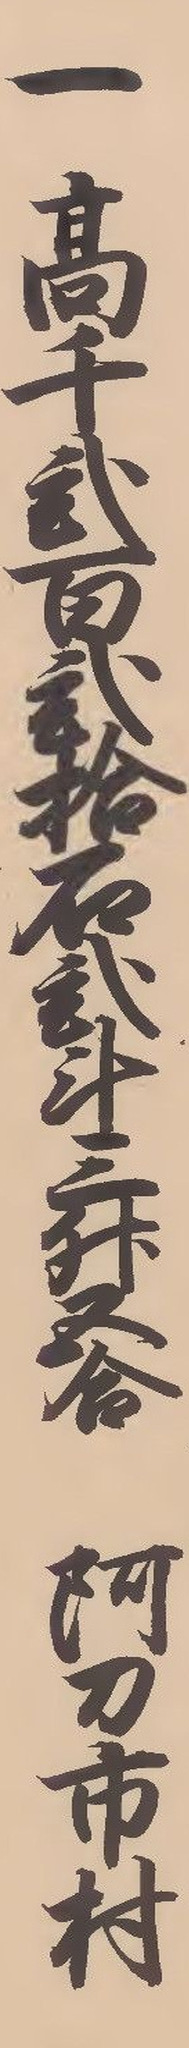一髙千弐百弐拾石弐斗三升五合阿刀市村

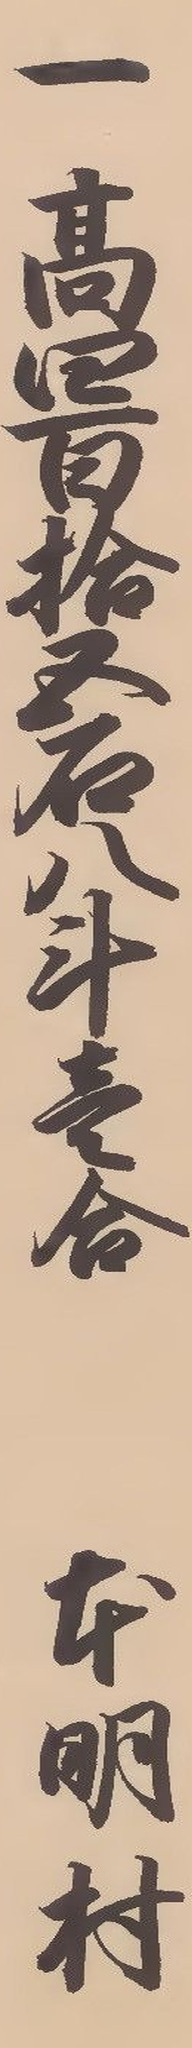一髙四百拾五石八斗壱合本明村
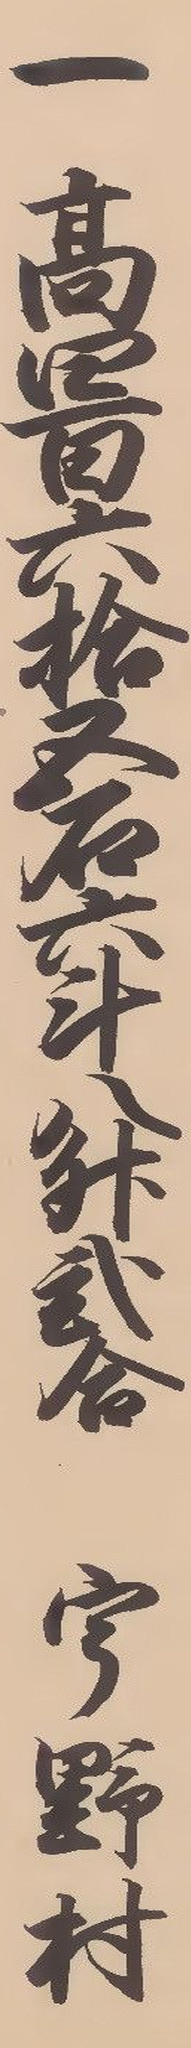一髙四百六拾五石六斗八升弐合宇野村
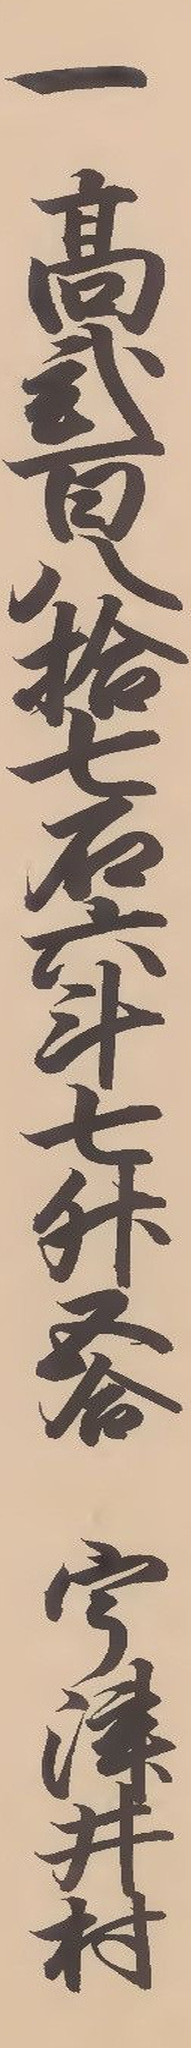一髙弐百八拾七石六斗七升五合宇津井村
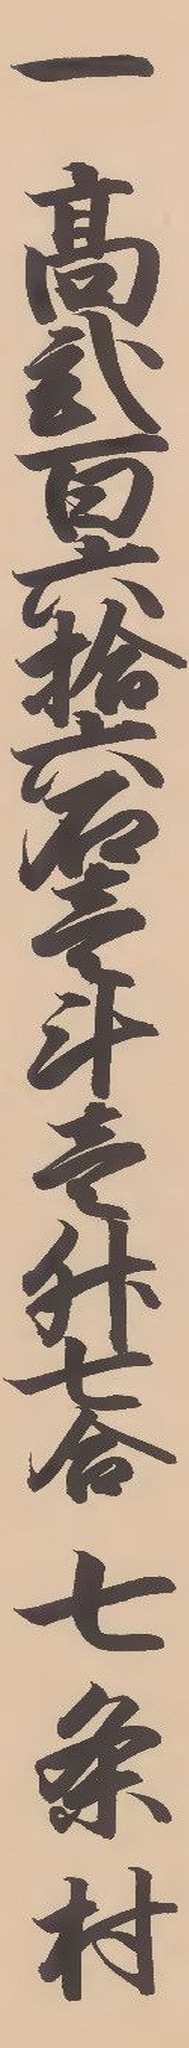一髙弐百六拾六石壱斗壱升七合七条村
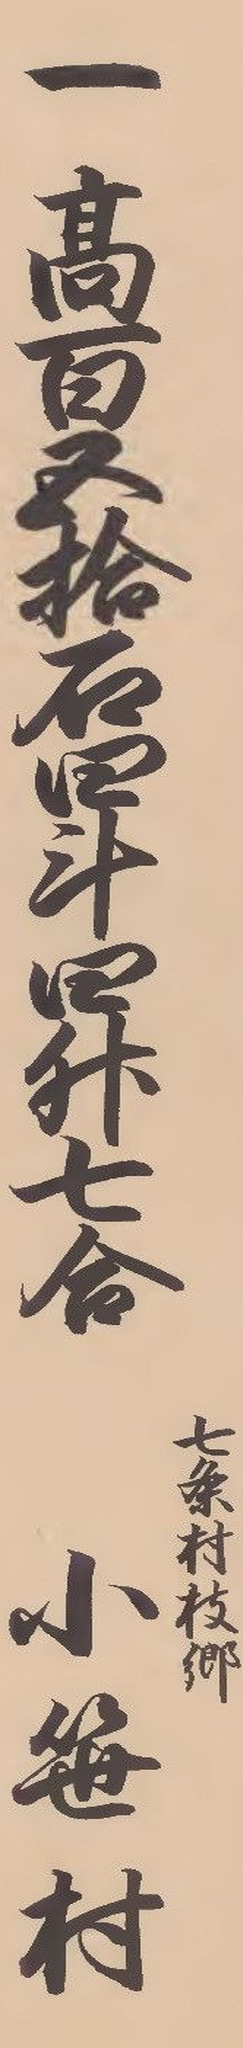一髙百五拾石四斗四升七合小笹村
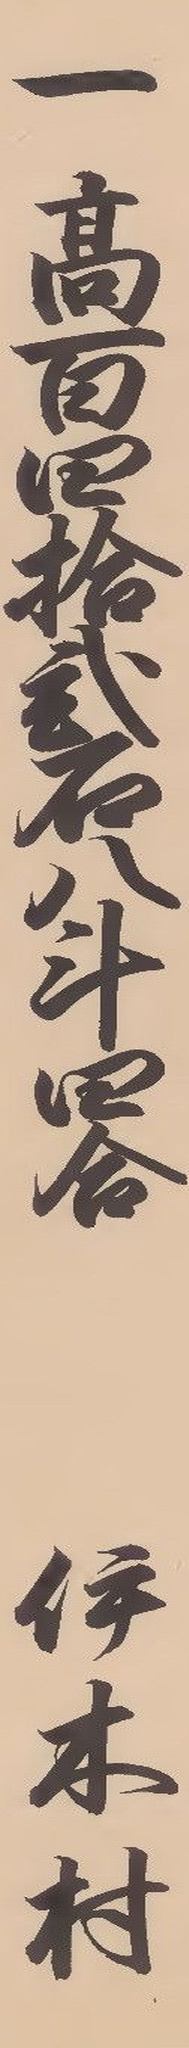一髙百四拾弐石八斗四合伊木村
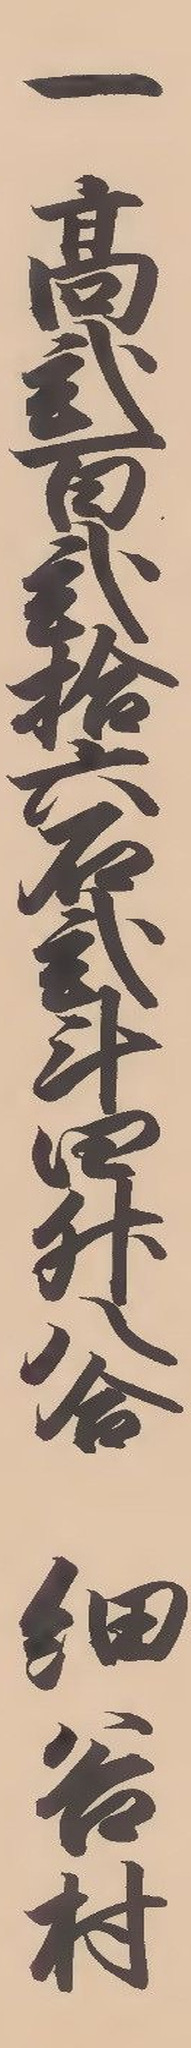一髙弐百弐拾六石弐斗四升八合細谷村
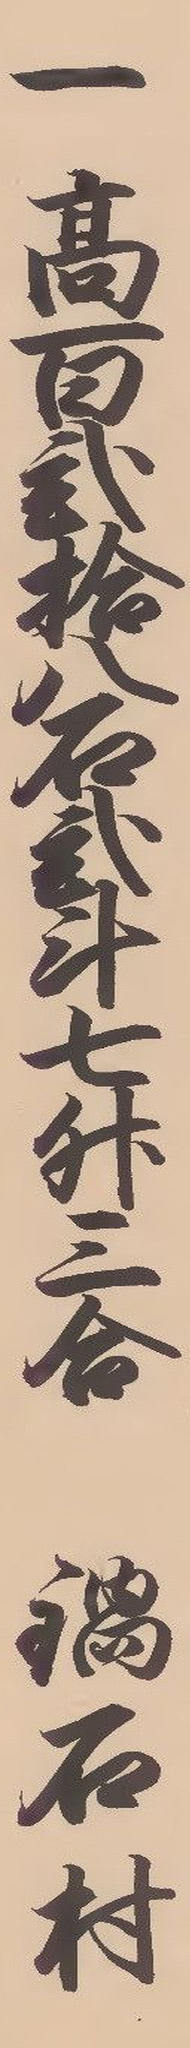一髙百弐拾八石弐斗七升三合鍋石村

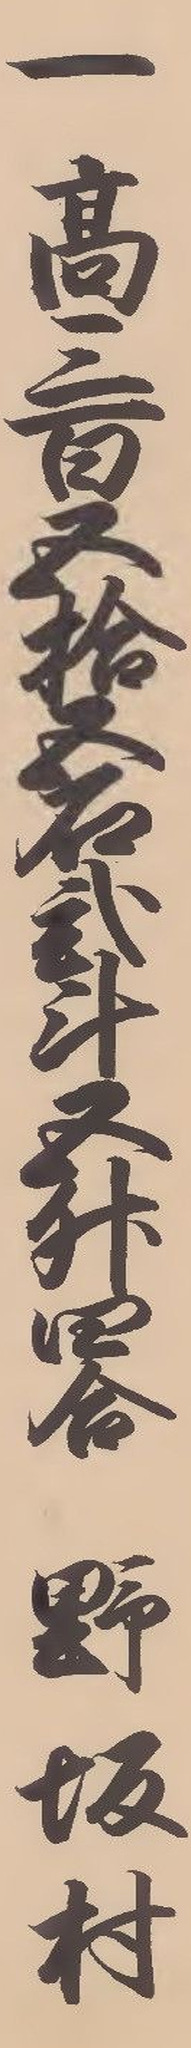一髙三百五拾五石弐斗五升四合野坂村
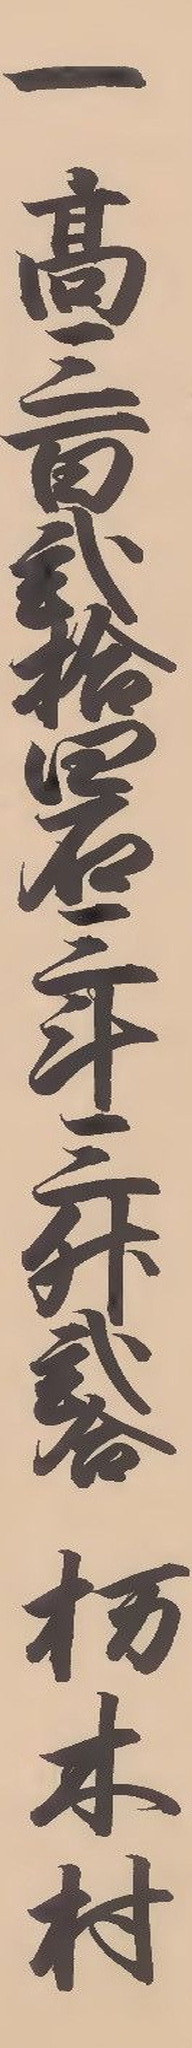一髙三百弐拾四石三斗三升弐合杤木村
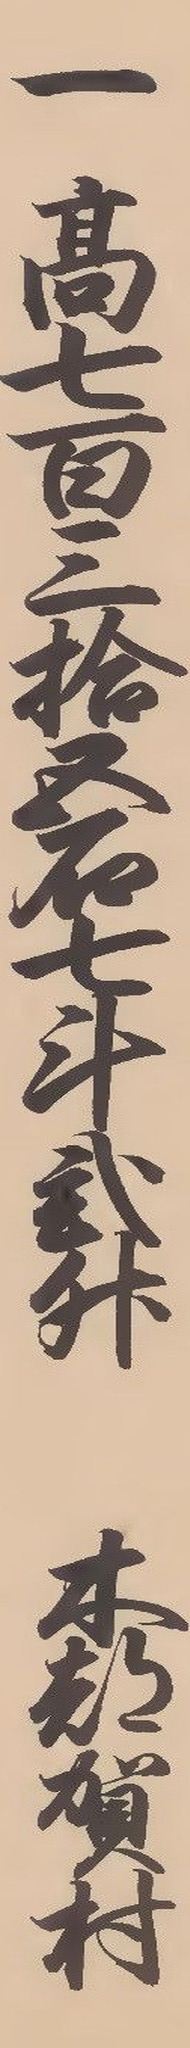一髙七百三拾五石七斗弐升木都賀村
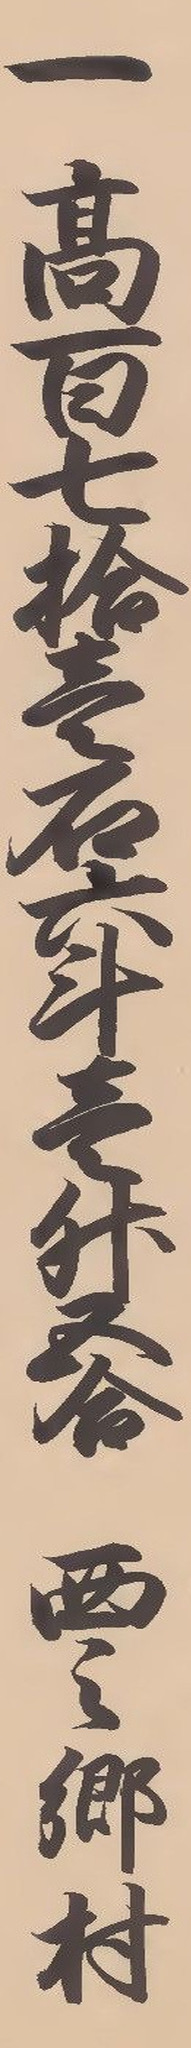一髙百七拾壱石六斗壱升五合西之郷村
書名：石見国郷帳
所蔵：国立公文書館 National Archives of Japan
